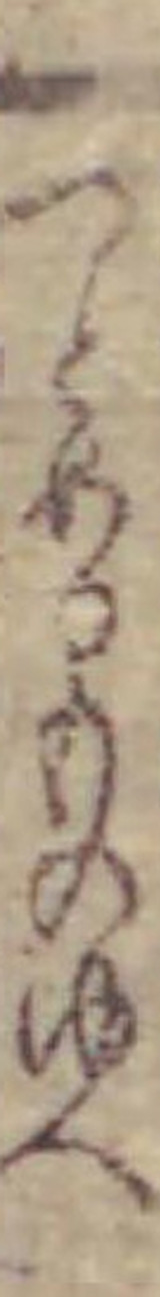つとめるものゆへ
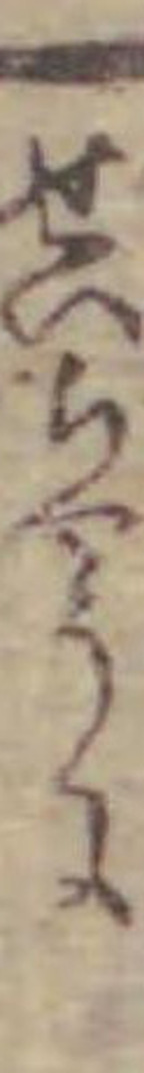せいちやうに
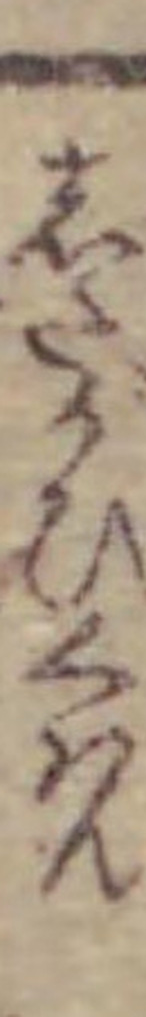したがひくはん
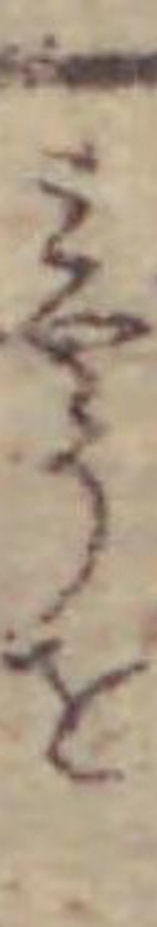みやうを
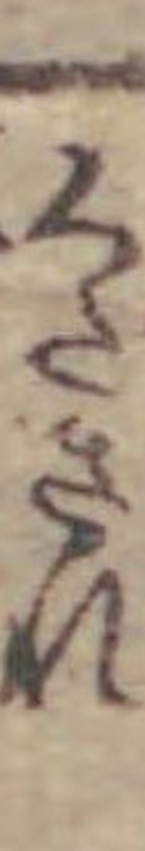くだされ
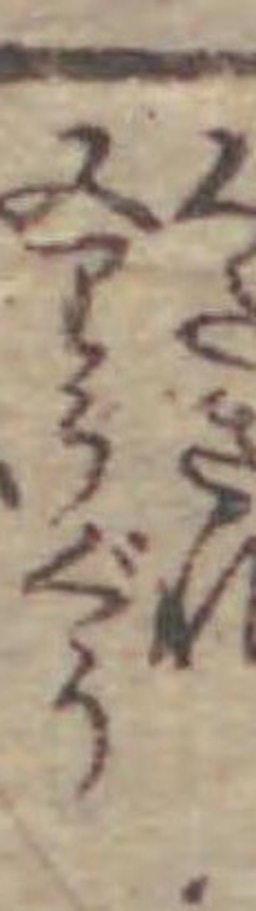又りうぐう
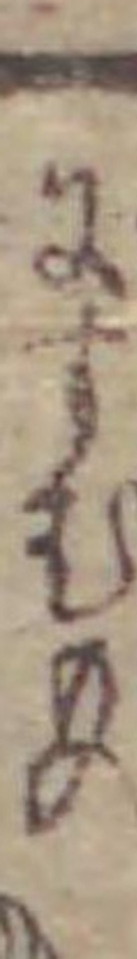にすむもの
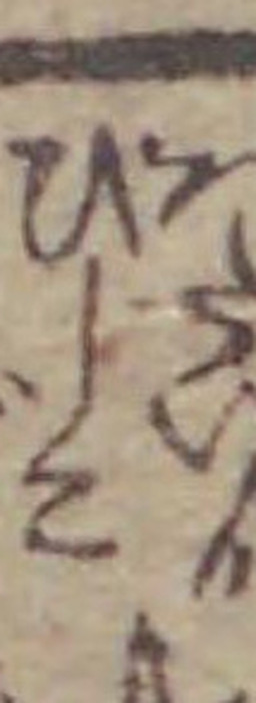ひしこ
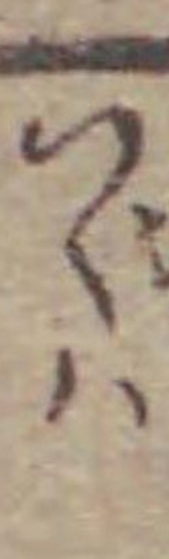つぐは
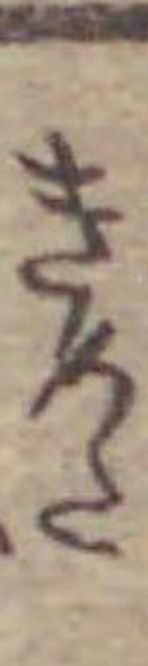きめた
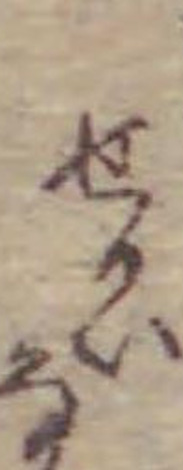せかい

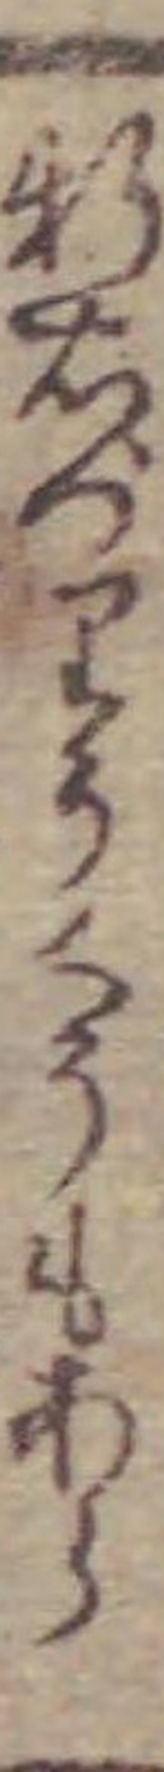新右衛門りうくうもあら
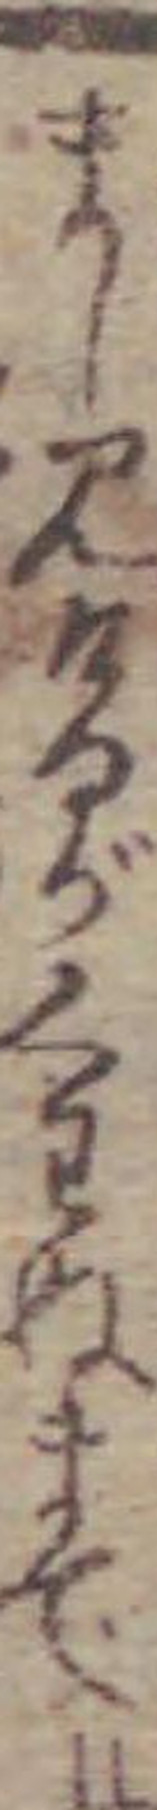まし見けるがくわぬまで
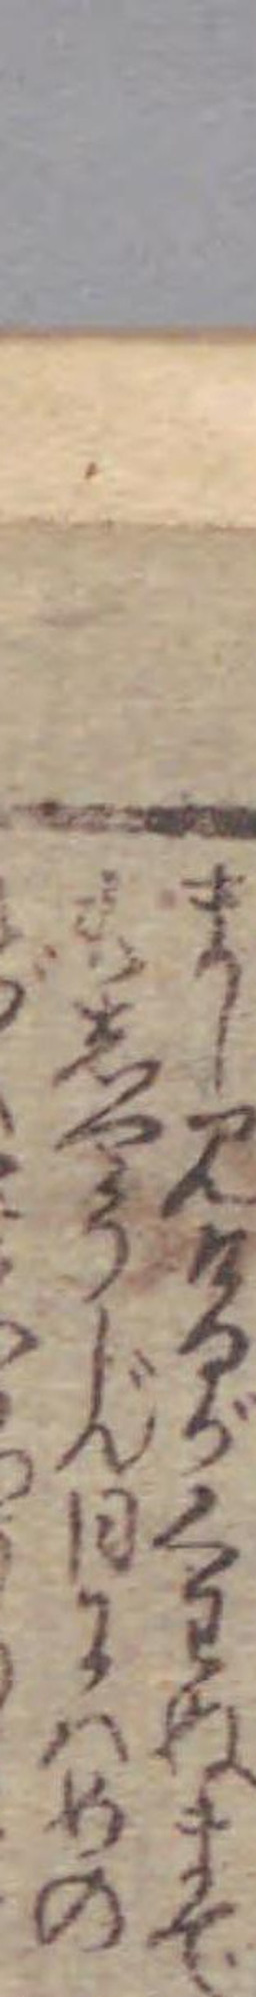もしやうじん日にはめの
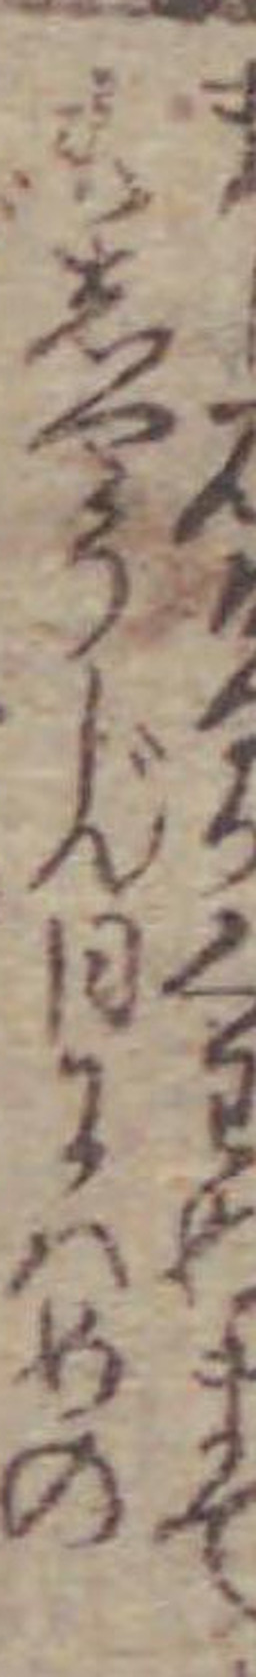もしやうじん日にはめの
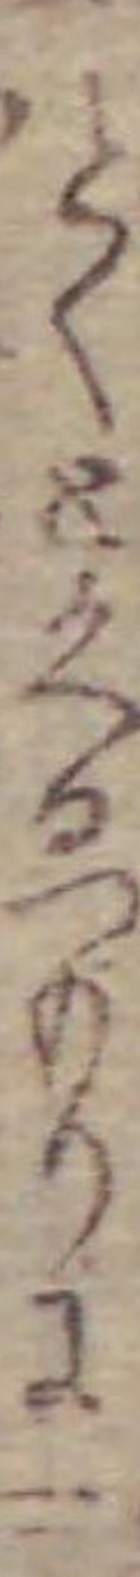どくとかへるつもりに
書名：即席耳学問 : 3巻
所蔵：国立国会図書館 National Diet Library, JAPAN
